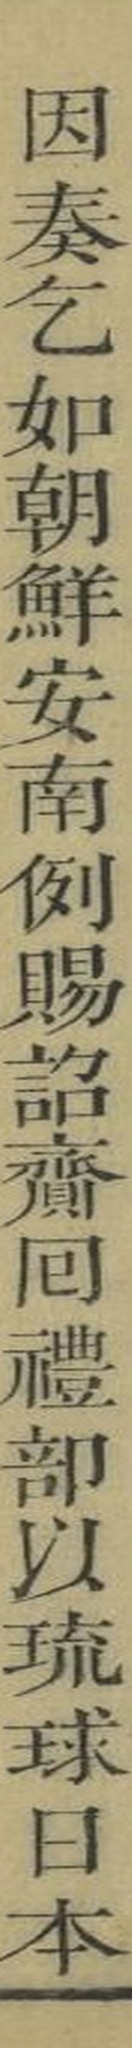因奏乞如朝鮮安南例賜詔齎回礼部以琉球日本
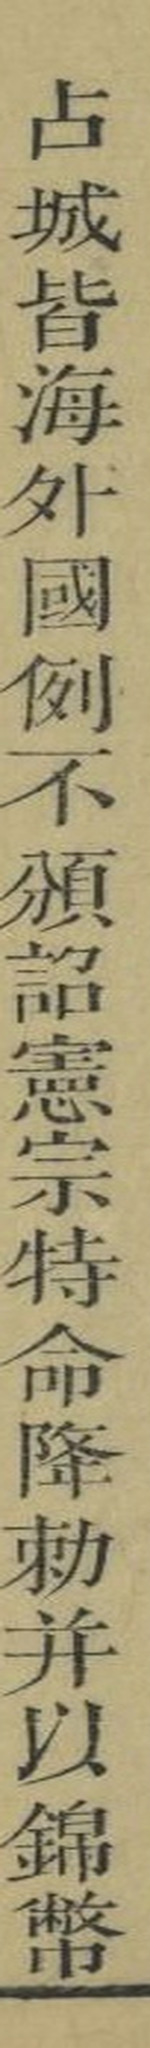占城皆海外国例不頒詔憲宗特命降勅并以錦幣
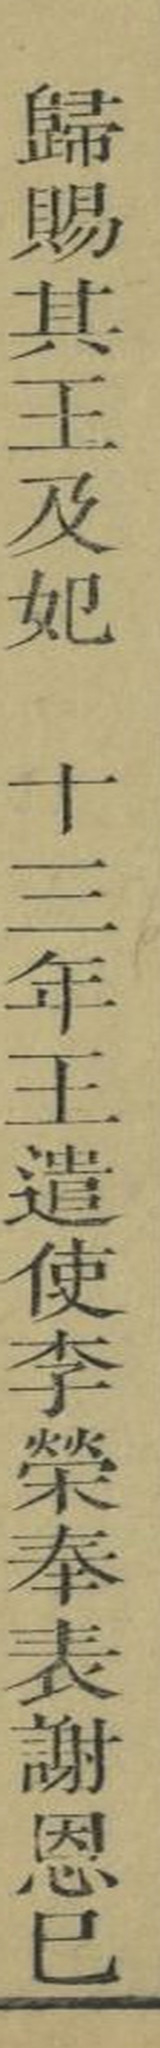帰賜其王及妃十三年王遣使李栄奉表謝恩巳
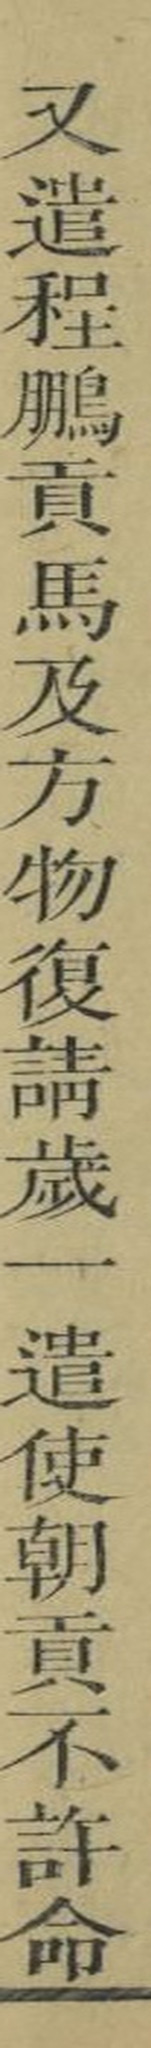又遣程鵬貢馬及方物復請歳一遣使朝貢不許命
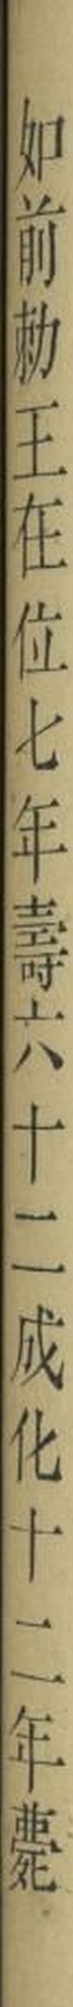如前勅王在位七年寿六十二成化十二年薨
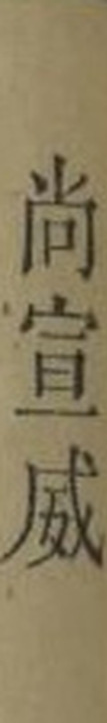尚宣威
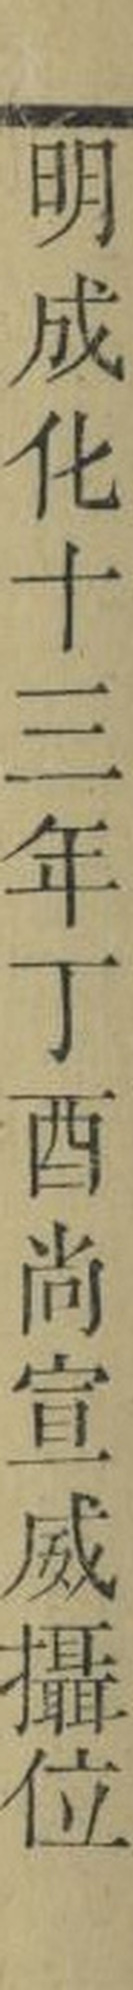明成化十三年丁酉尚宣威摂位
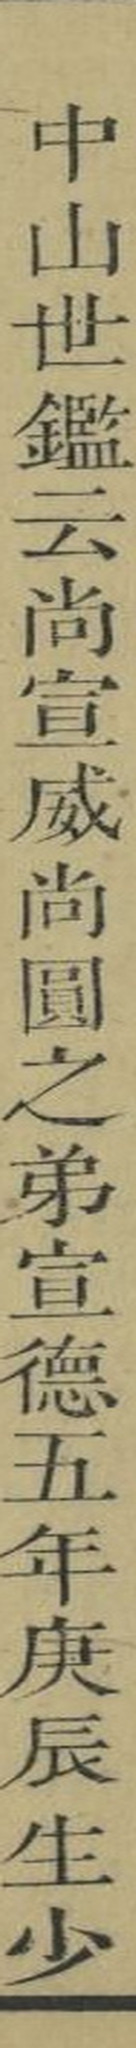中山世鑑云尚宣威尚円之弟宣徳五年庚辰生少
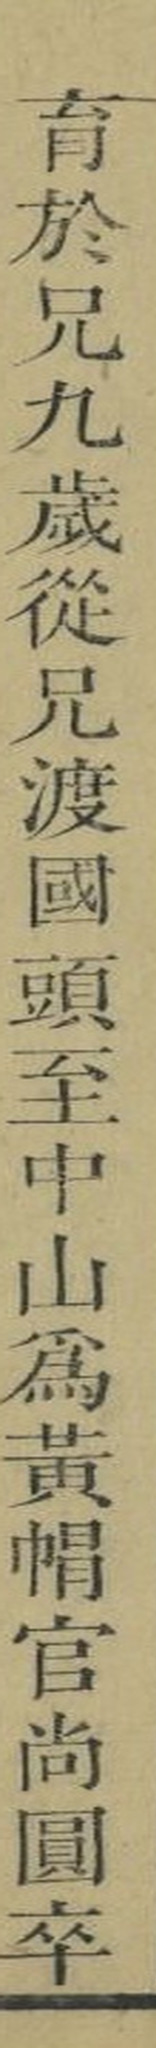育於兄九歳従兄渡国頭至中山為黄帽官尚円卒
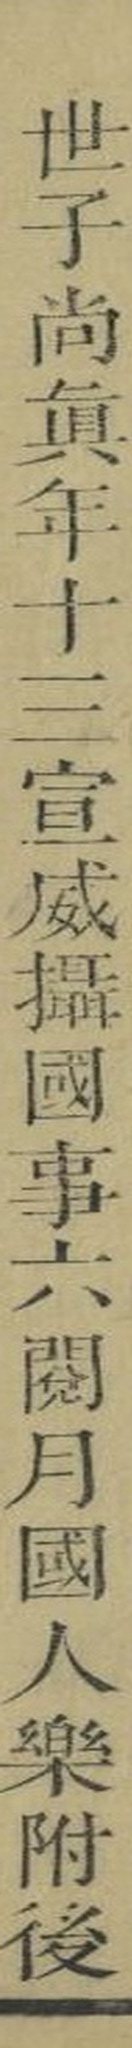世子尚真年十三宣威摂国事六閲月国人楽附後
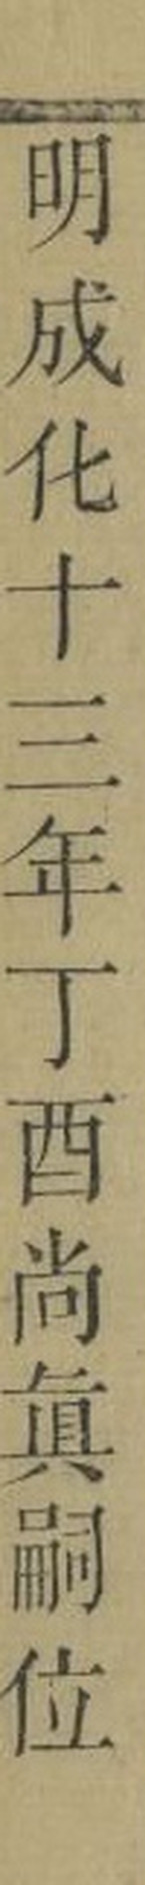明成化十三年丁酉尚真嗣位

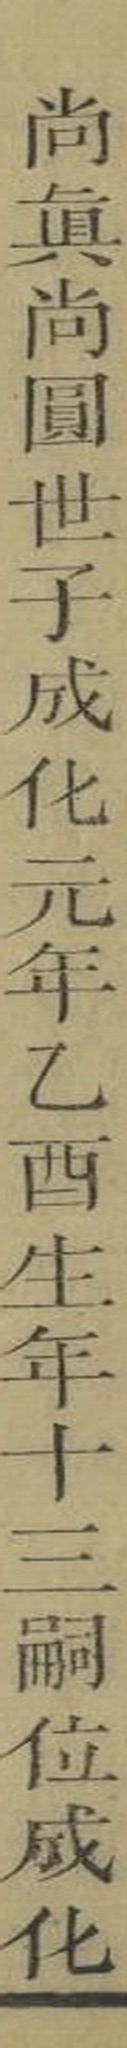尚真尚円世子成化元年乙酉生年十三嗣位成化
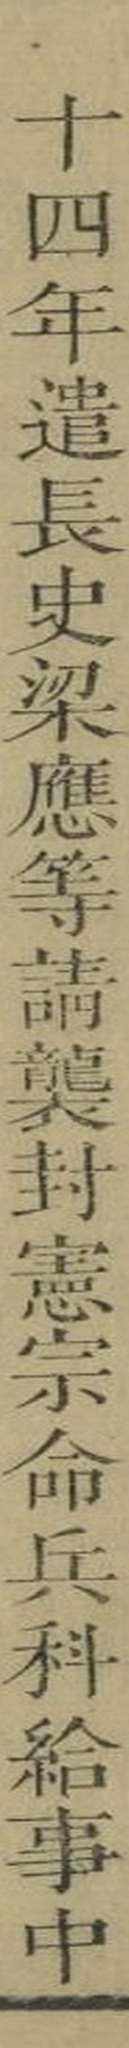十四年遣長史梁応等請襲封憲宗命兵科給事中
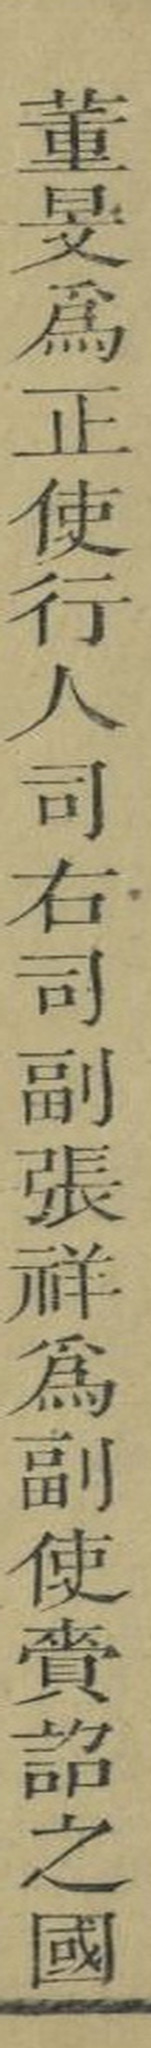董旻為正使行人司右司副張祥為副使賚詔之国
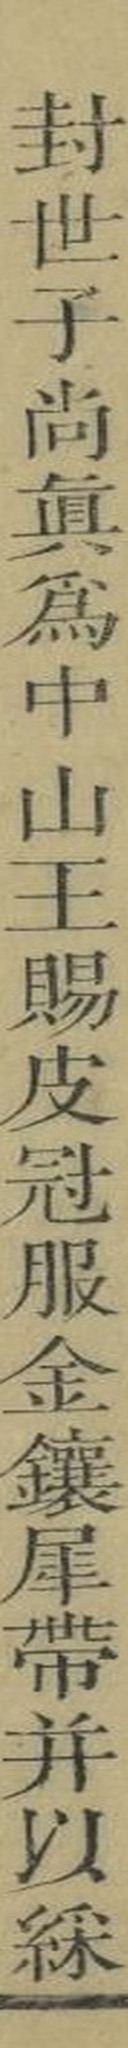封世子尚真為中山王賜皮冠服金鑲犀帯并以綵
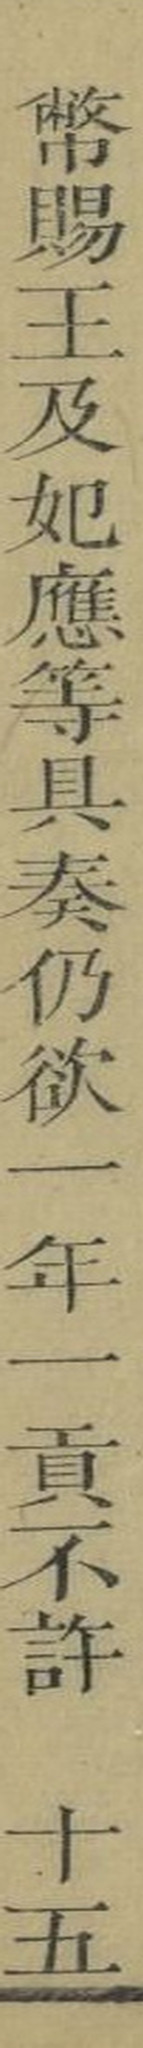幣賜王及妃応等具奏仍欲一年一貢不許十五
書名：中山伝信録 巻三
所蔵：University of the Ryukyus Library
